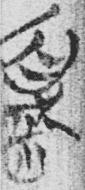頤
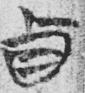貞
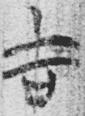吉
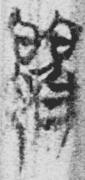觀
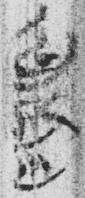頤
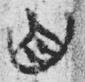自
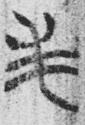求
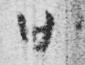口
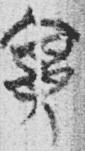實
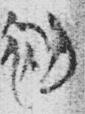初
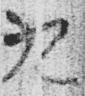九
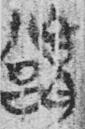○（舍）
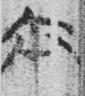尒（爾）
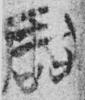○（靈）
